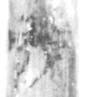戌
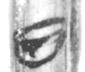日
